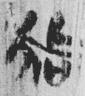狗（茍）
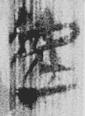○（吾）
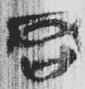君
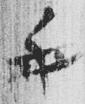母（毌）
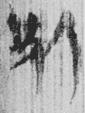死
